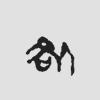咎
